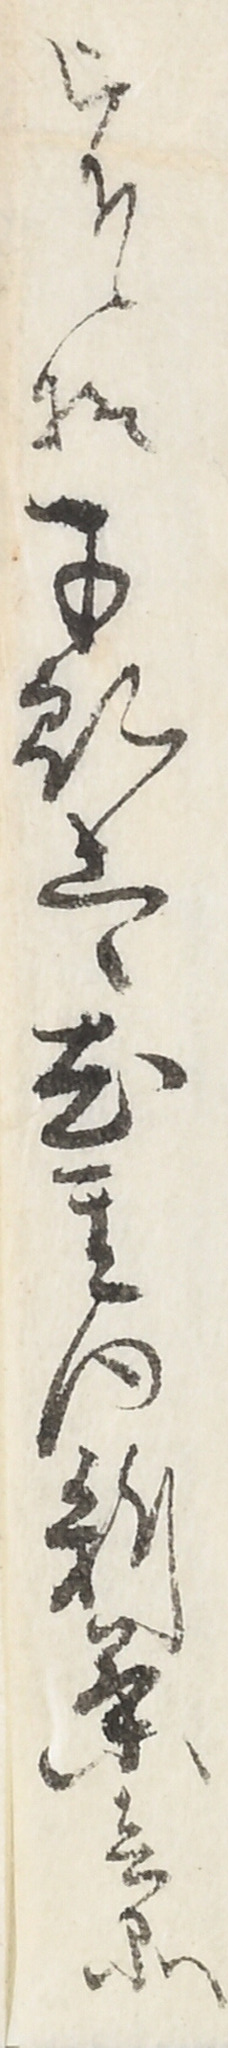被下候儀奉願上尤其内新茶一品
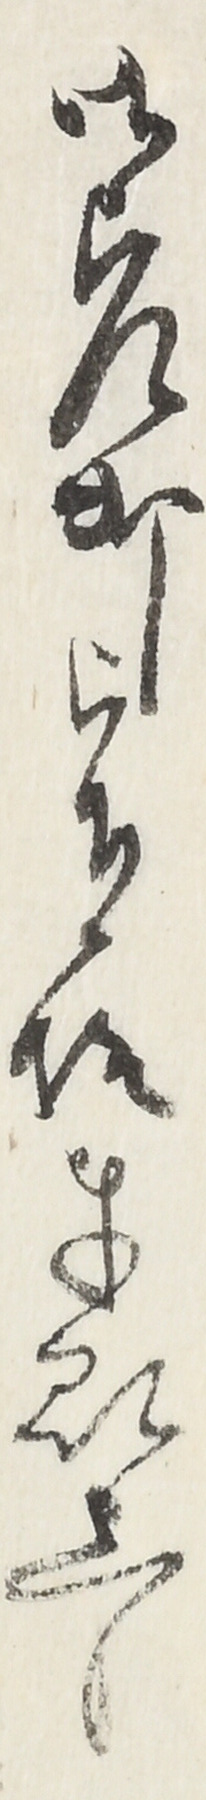御差出し被下候儀奉願上候
